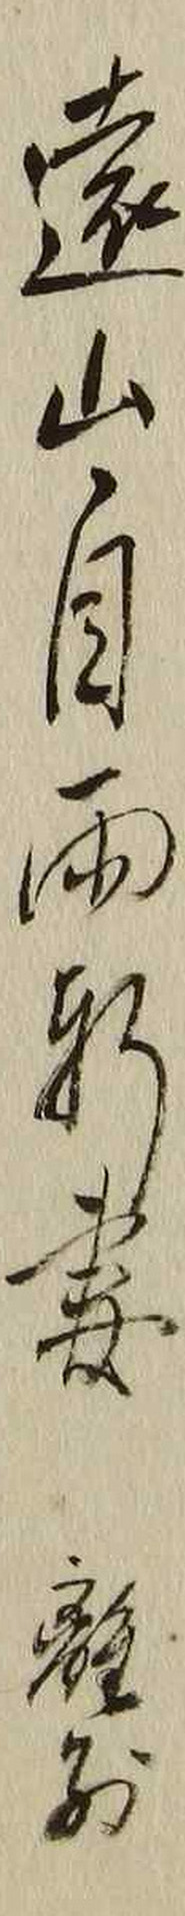女遠山自雨軒妻離別
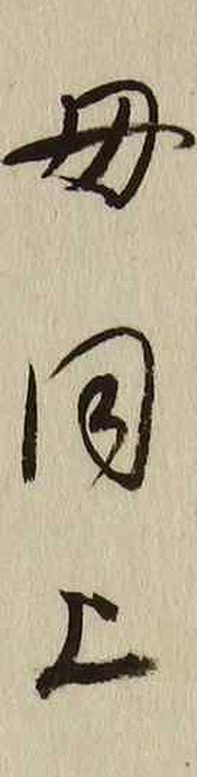母同上
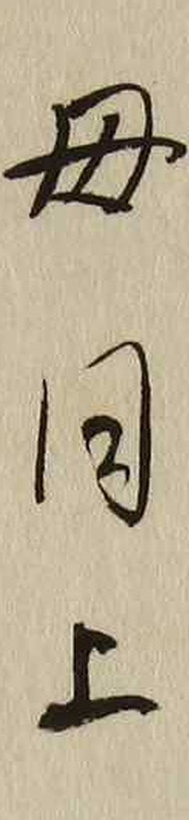母同上
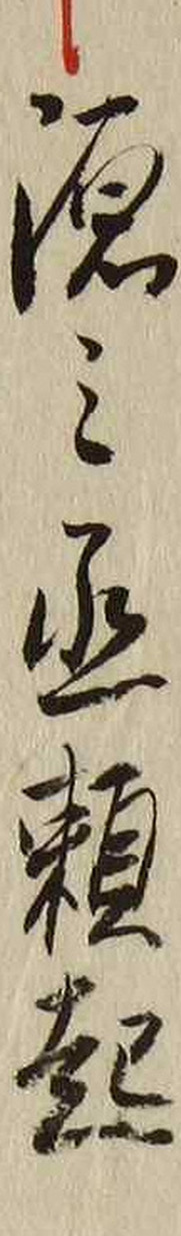源之丞頼起
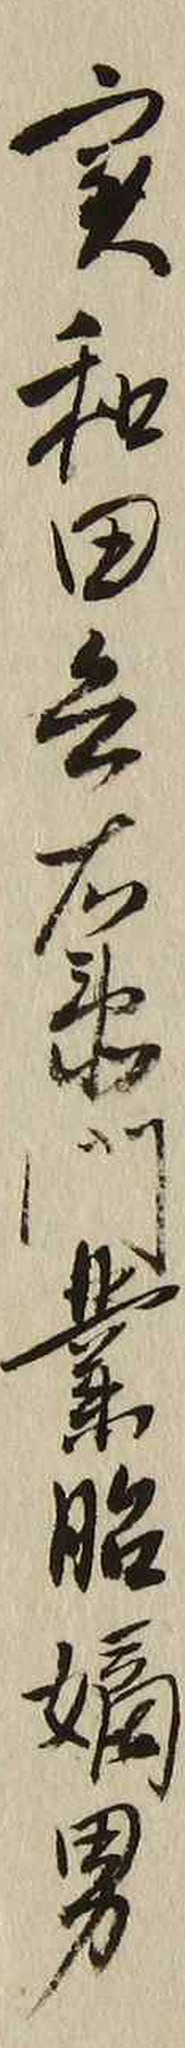実和田兵右衛門業昭嫡男
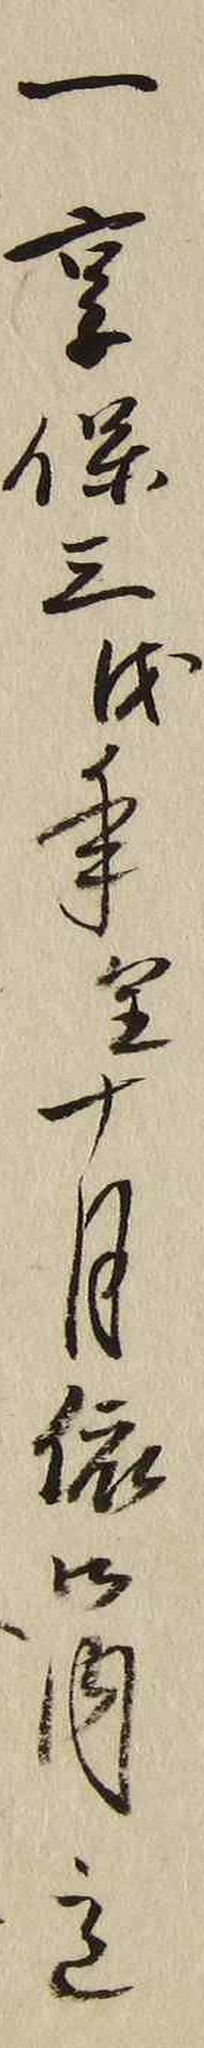一享保三戌年閏十月依御内意
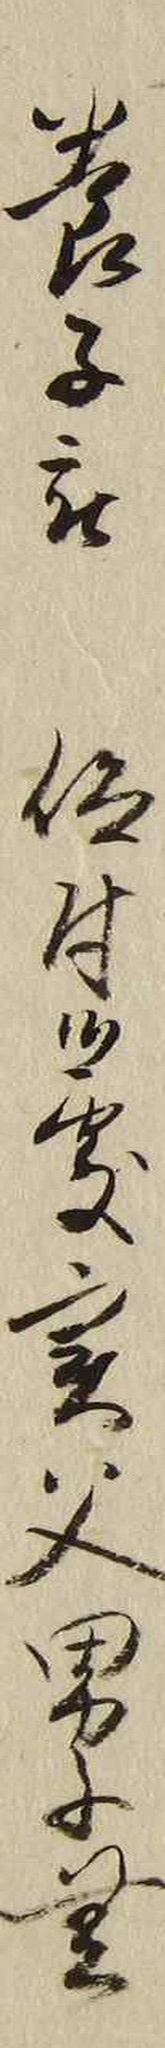養子被仰付候処実父男子無

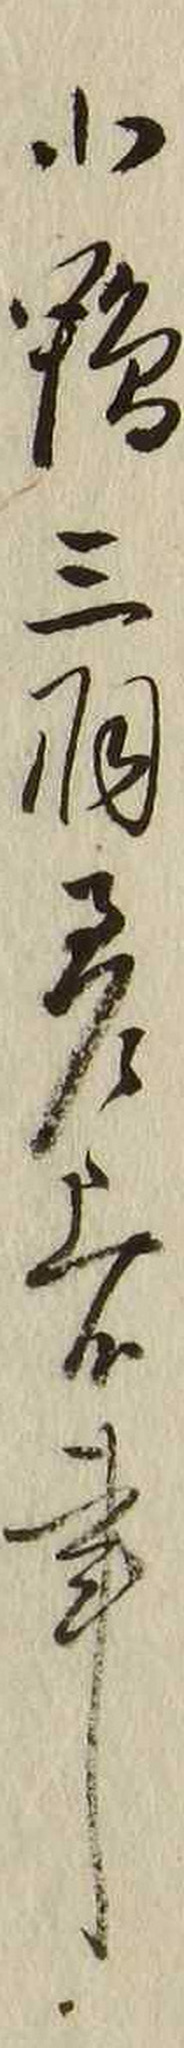小鴨三羽差上候事
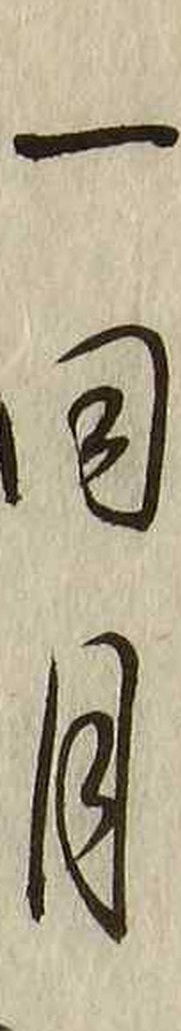一同月
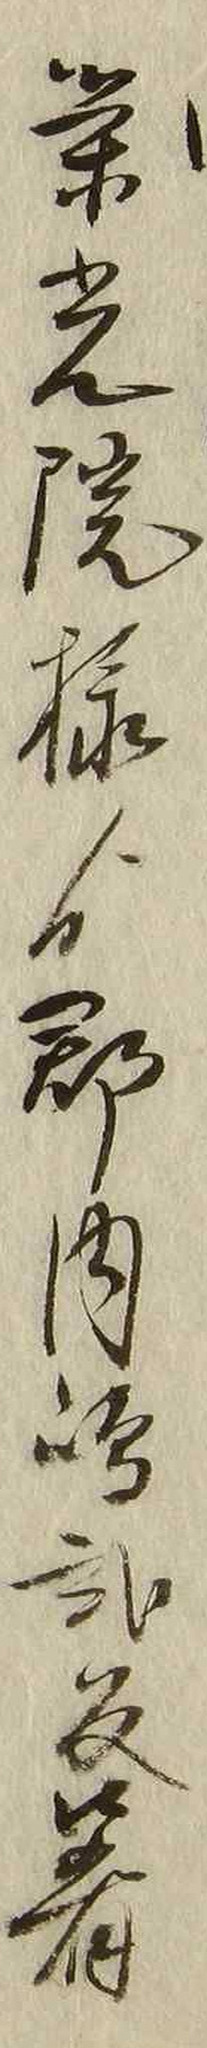栄光院様ゟ郡内島弐反御肴
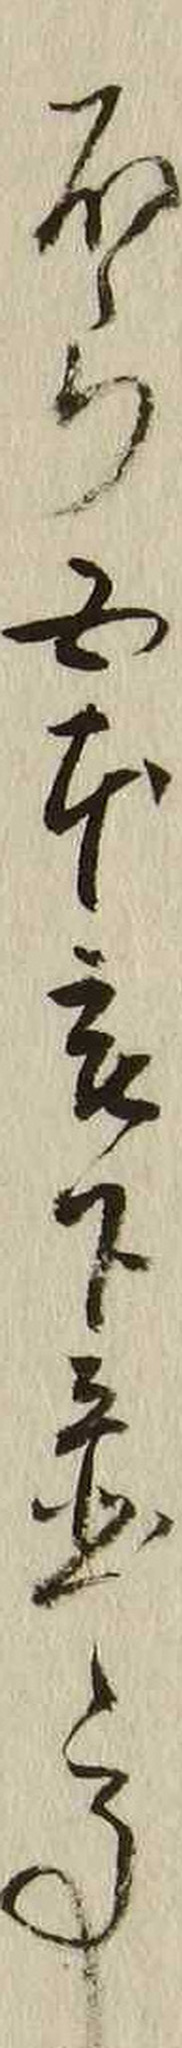ほら五本被下置候事
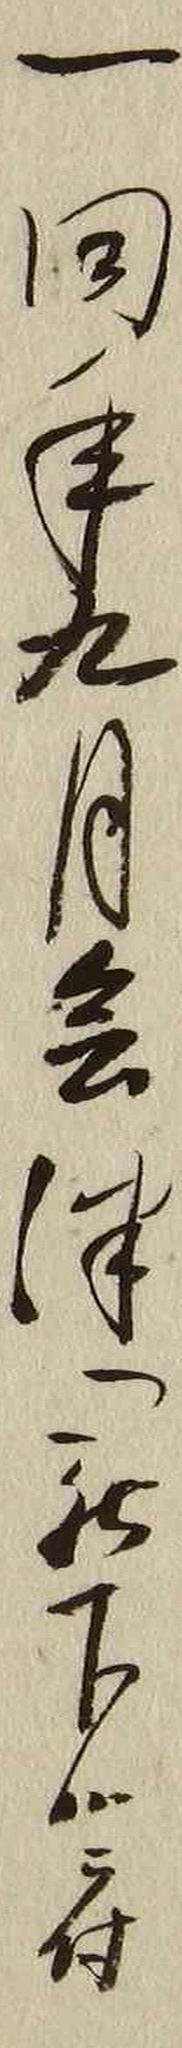一同年九月会津へ罷下候ニ付
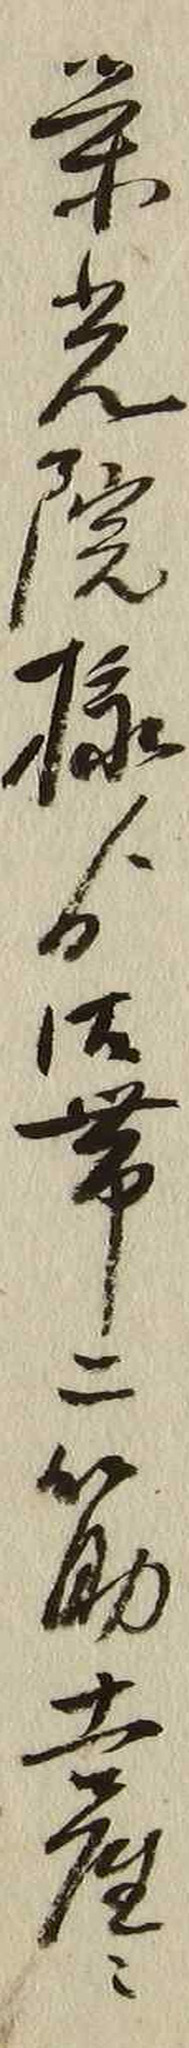栄光院様ゟ御帯二筋土産ニ
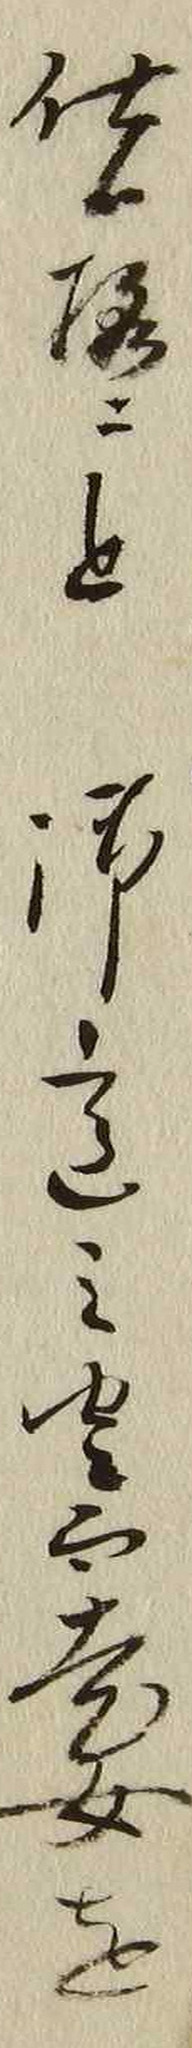仕候様ニと御意之由ニ而老女を
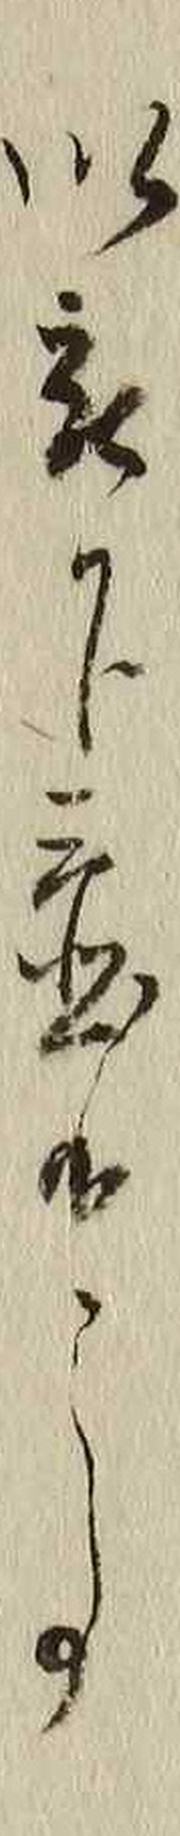以被下置候事
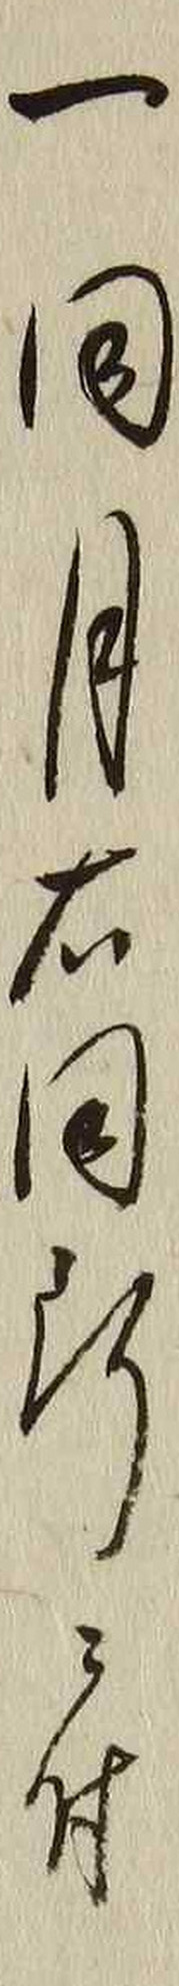一同月右同断ニ付
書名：諸士系譜　巻之351　す之部1
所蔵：会津若松市立会津図書館
